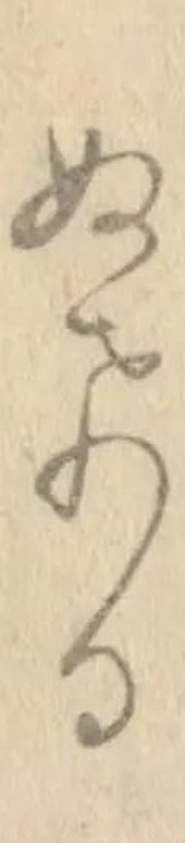ぬける
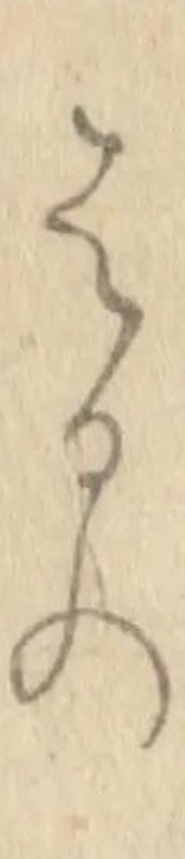はるの

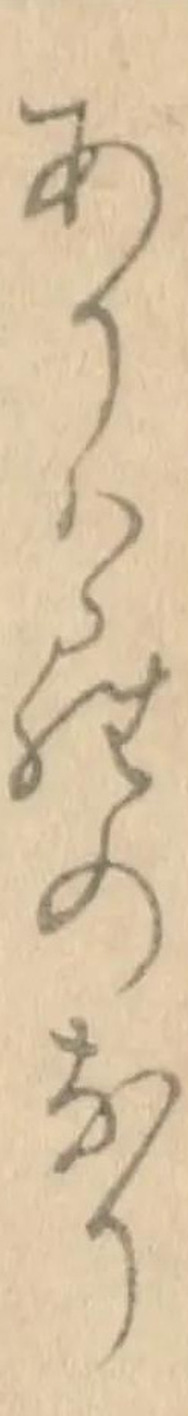ありはらのなり
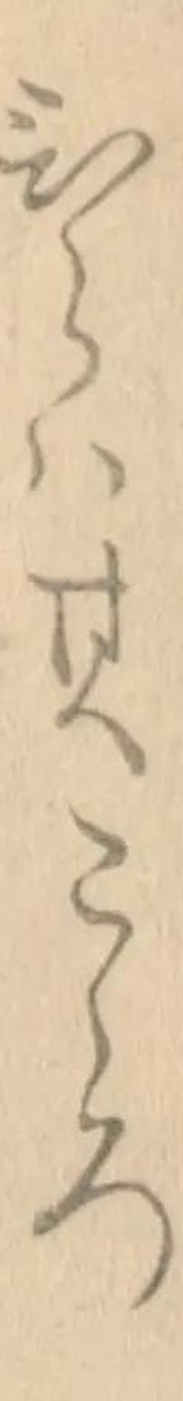ひらは其こゝろ
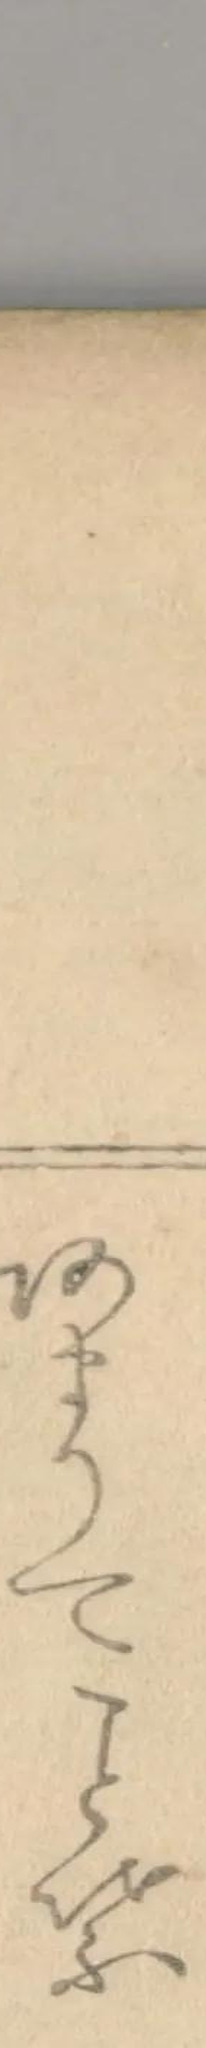あまりてこと葉
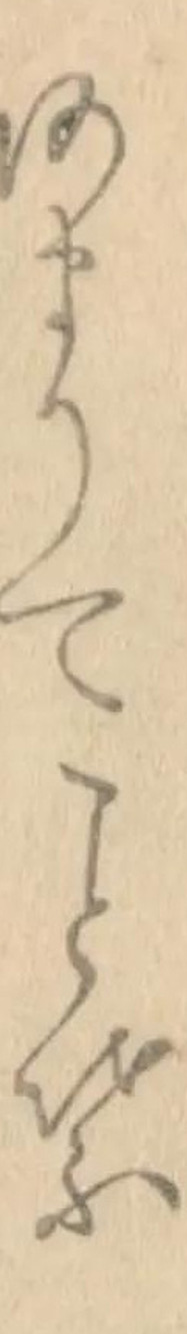あまりてこと葉
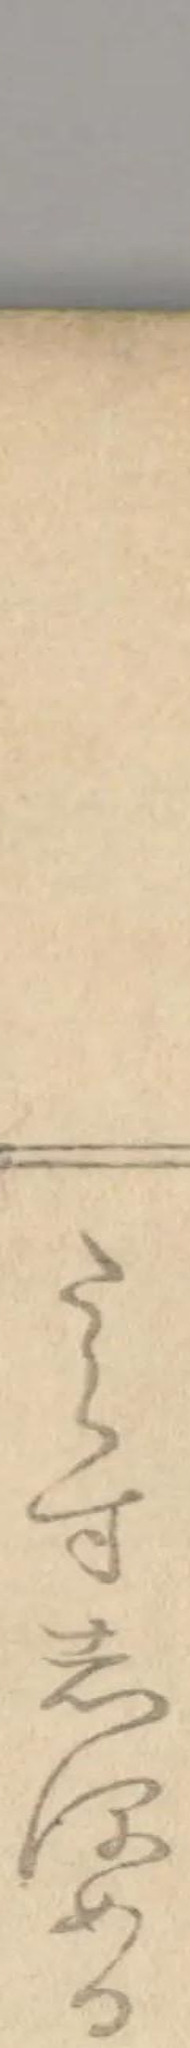たらすしほめる
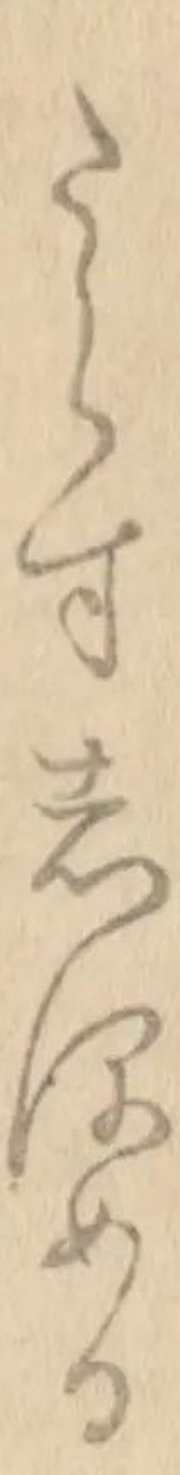たらすしほめる
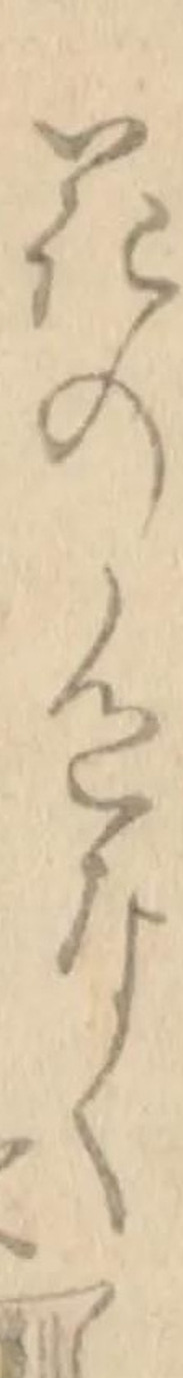花の色なくて
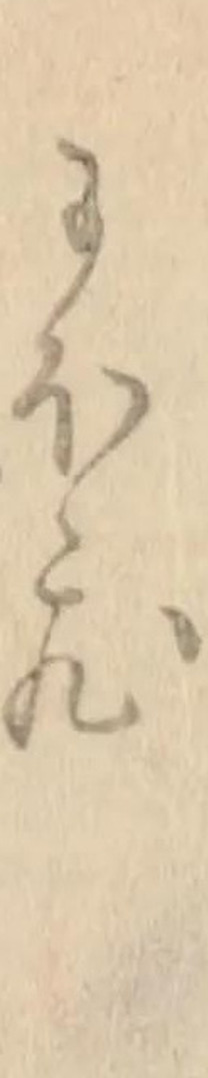にほひ
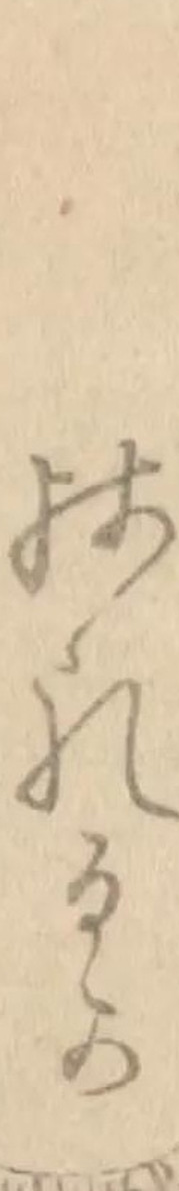残れるか
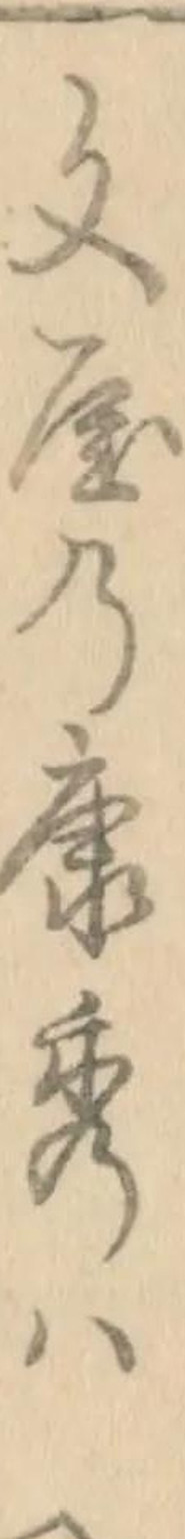文屋の康秀は
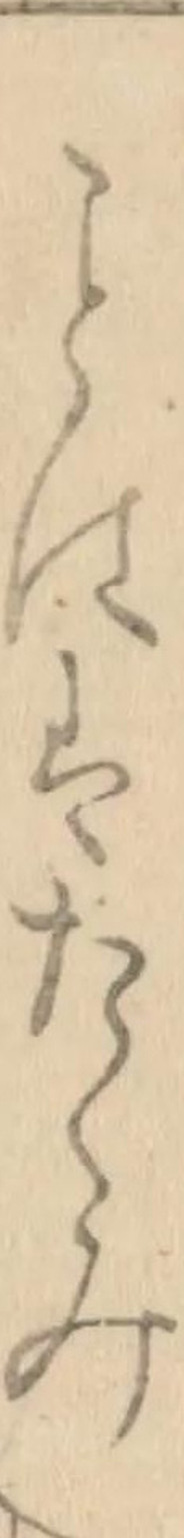ことははたくみ
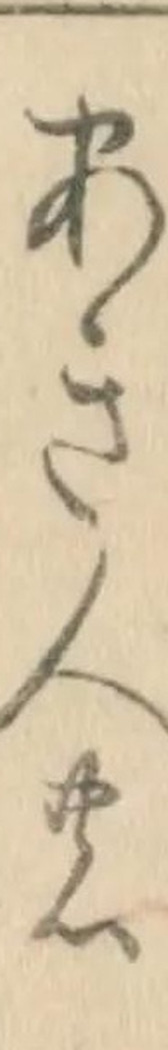あき人の
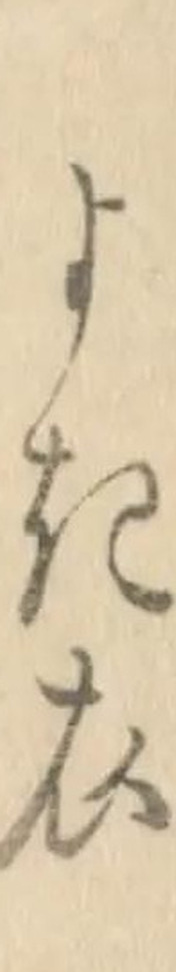よき衣
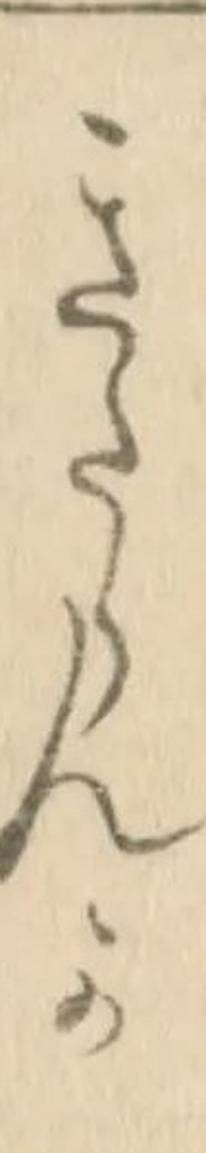きたらんか
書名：錦百人一首あつま織
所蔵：国立国会図書館 National Diet Library, JAPAN
